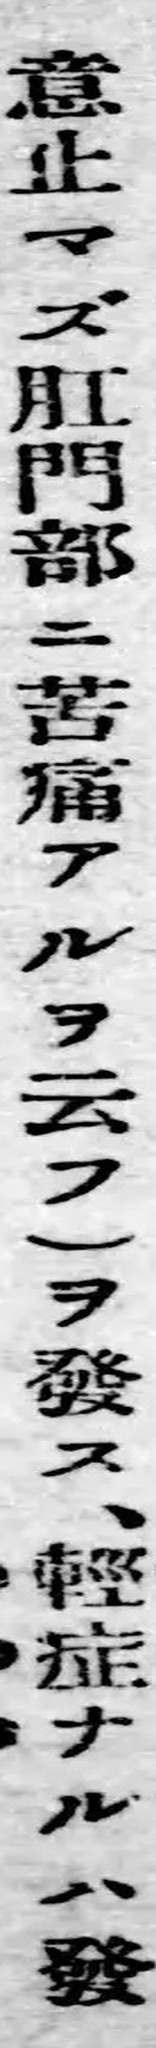意止マズ肛門部ニ苦痛アルヲ云フ)ヲ發ス、輕症ナルハ發
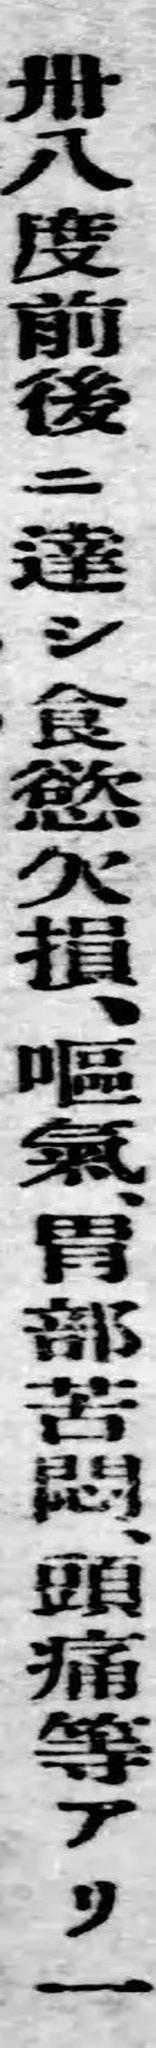卅八度前後ニ達シ食慾欠損、嘔気、胃部苦悶、頭痛等アリ一
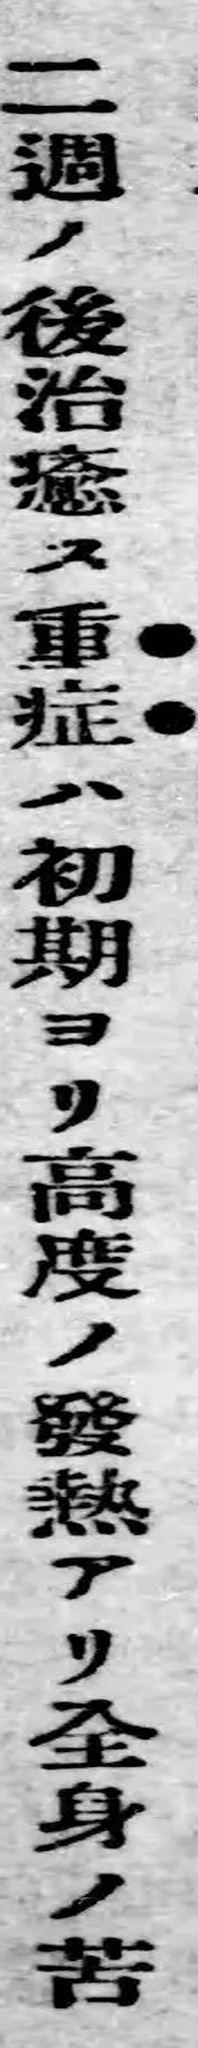二週ノ後治癒ス重症ハ初期ヨリ高度ノ發熱アリ全身ノ苦
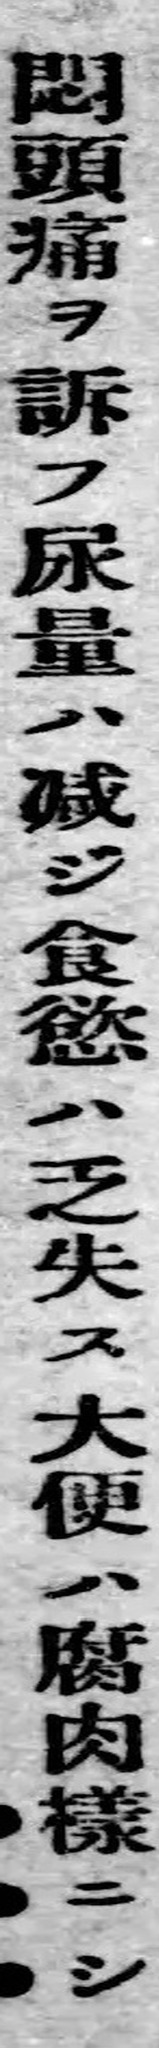悶頭痛ヲ訴フ尿量ハ減ジ食慾ハ乏失ス大便ハ腐肉樣ニシ
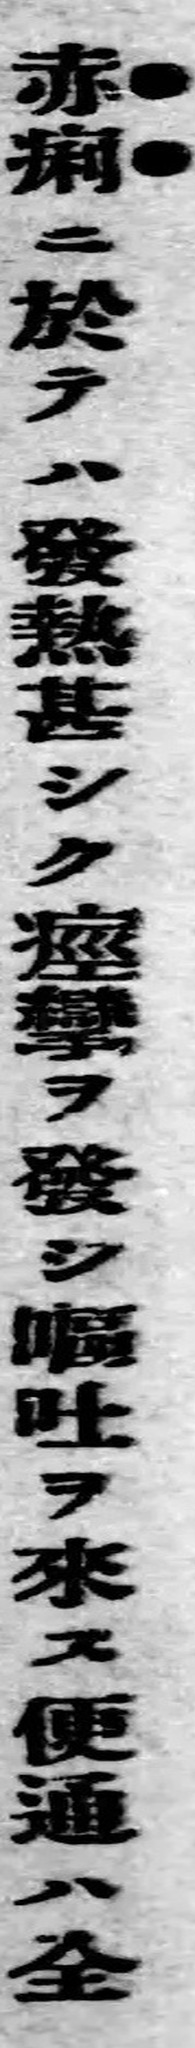赤痢ニ於テハ發熱甚シク痙攣ヲ發シ嘔吐ヲ來ス便通ハ全
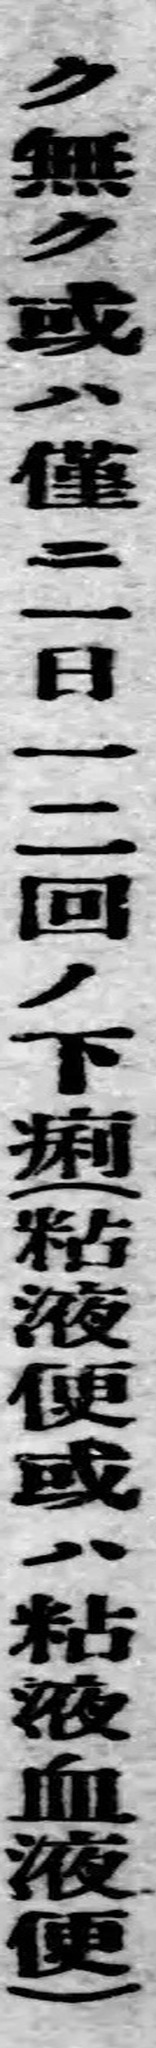ク無ク或ハ僅ニ一日一ニ回ノ下痢(粘液便或ハ粘液血液便)
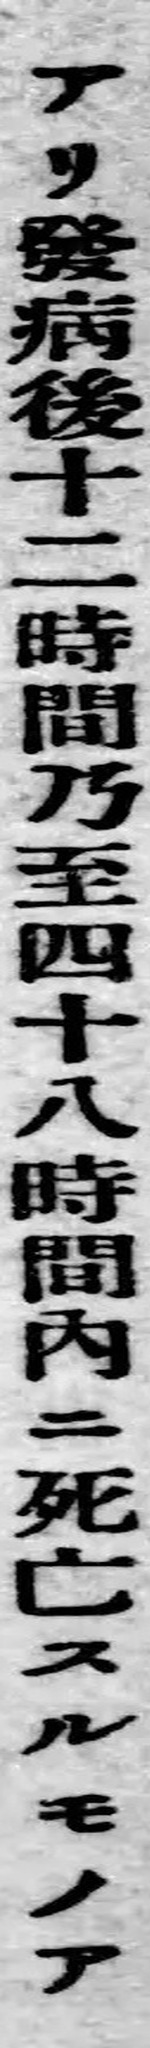アリ發病後十二時間乃至四十八時間内ニ死亡スルモノア
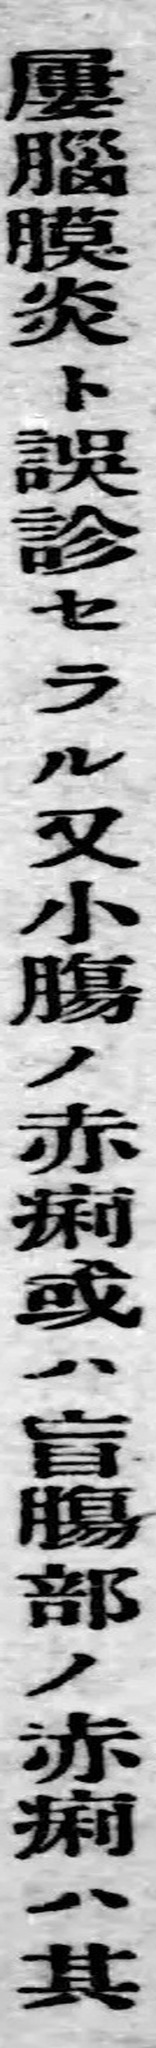屢腦膜炎ト誤診セラル又小膓ノ赤痢或ハ盲膓部ノ赤痢ハ其
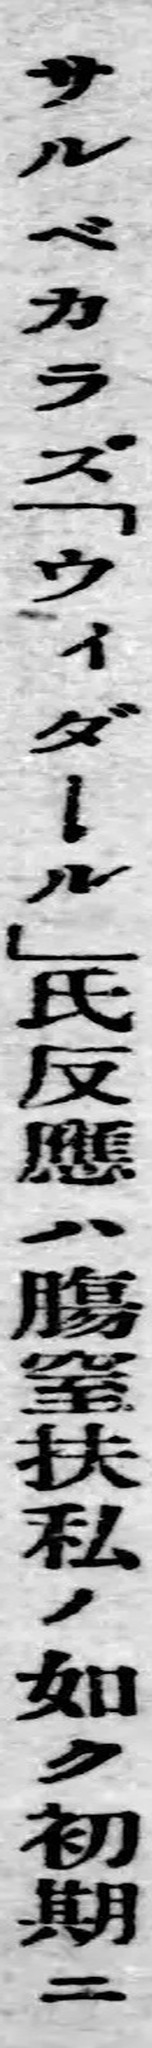サルベカラズ「ウィダール」氏反應ハ膓窒扶私ノ如ク初期ニ
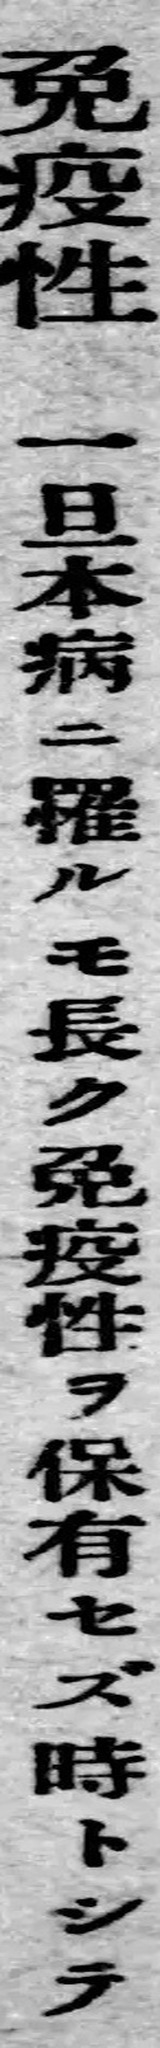免疫性一旦本病ニ罹ルモ長ク免疫性ヲ保有セズ時トシテ

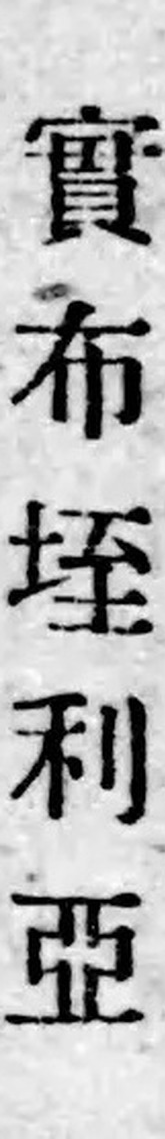實布垤利亞
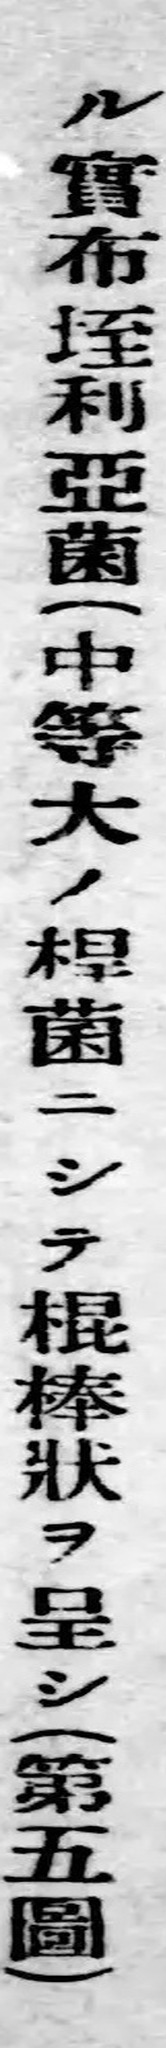リ實布垤利亞(中等大ノ桿菌ニシテ棍棒狀ヲ呈シ(第五圖)
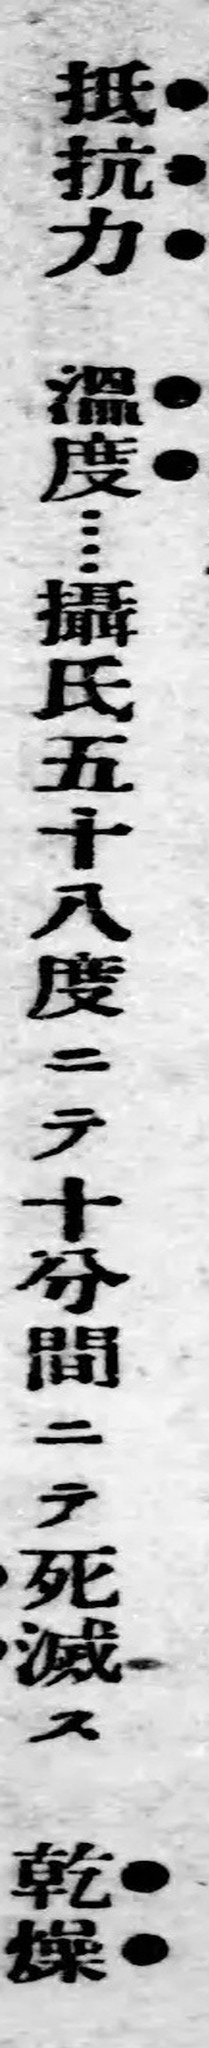抵抗力溫度…攝氏五十八度ニテ十分間ニテ死滅ス乾燥
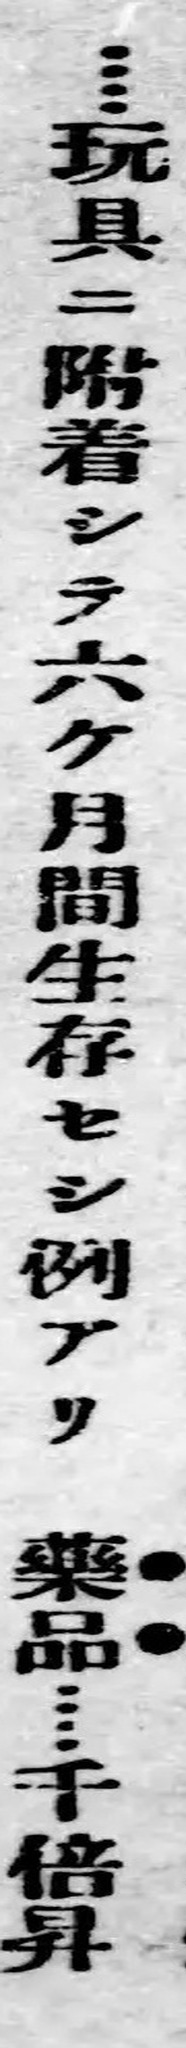…玩具ニ附着シテ六ヶ月間生存セシ例アリ藥品…千倍昇
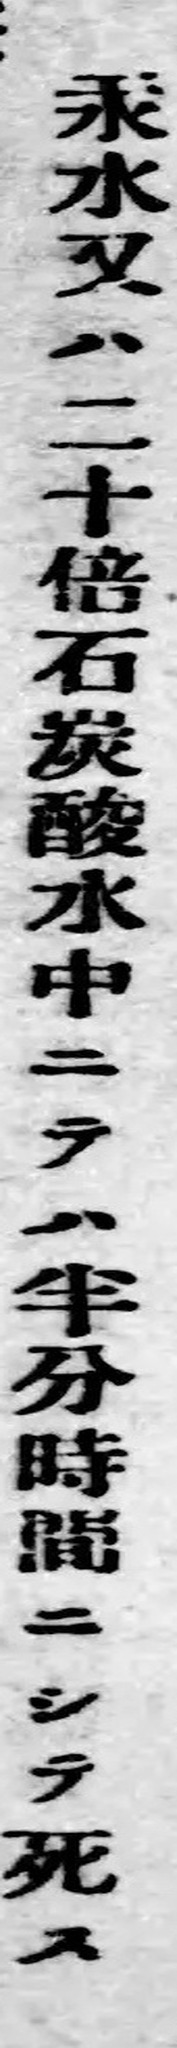汞水又ハ二十倍石炭酸水中ニテハ半分時間ニシテ死ス
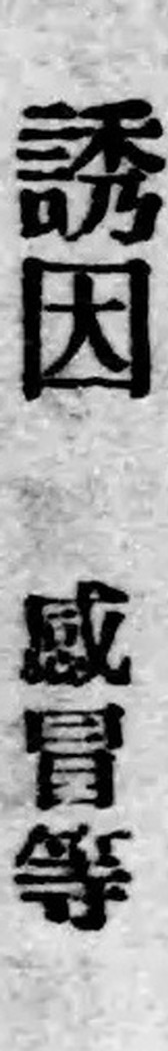誘因感冒等
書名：袖珍防疫必携
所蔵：国立国会図書館 National Diet Library, JAPAN
